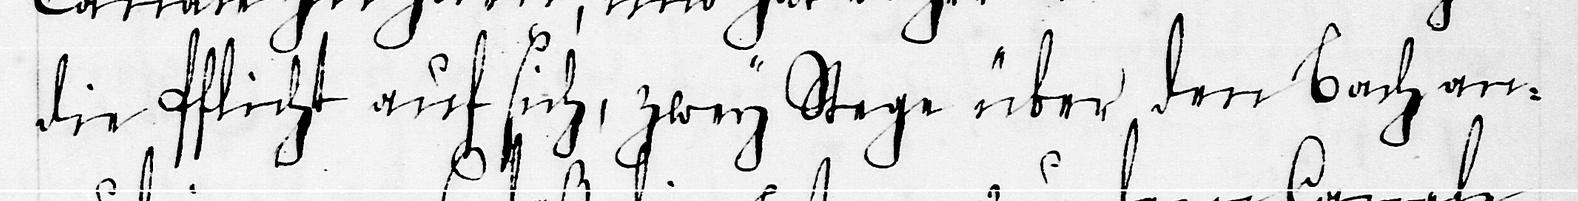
die Pflicht auf sich, zwey Stege über den Bach an¬
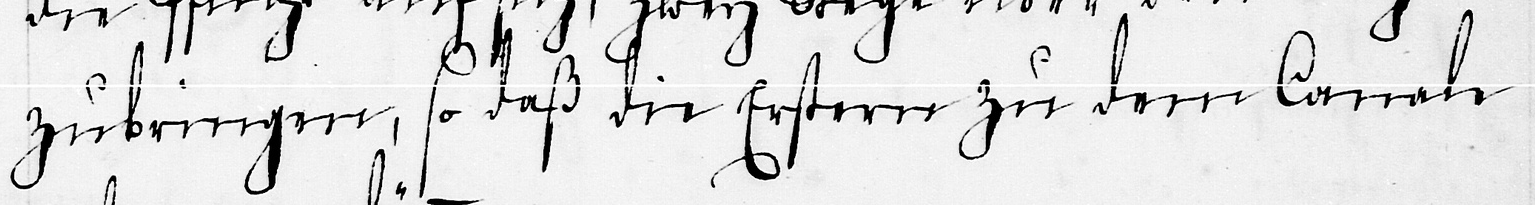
zubringen, so daß die Erstern zu dem Canale
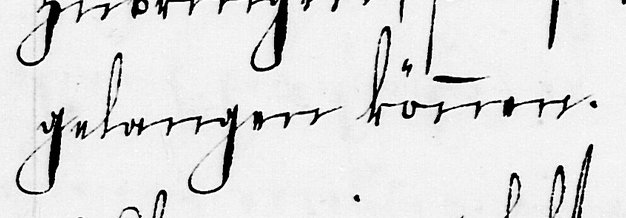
gelangen können.
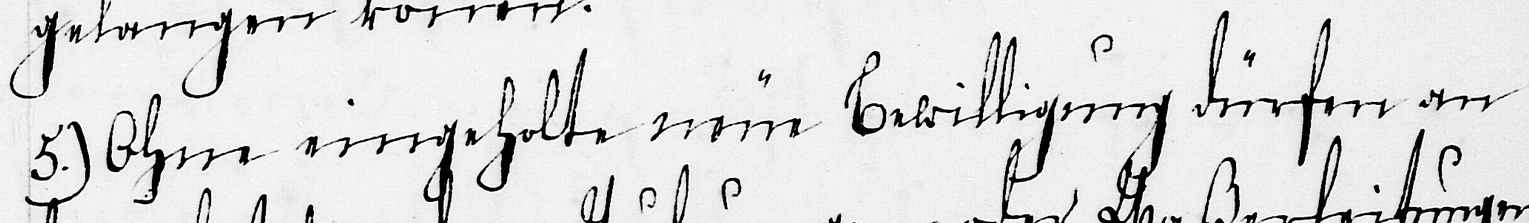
5.) Ohne eingeholte neue Bewilligung dürfen an
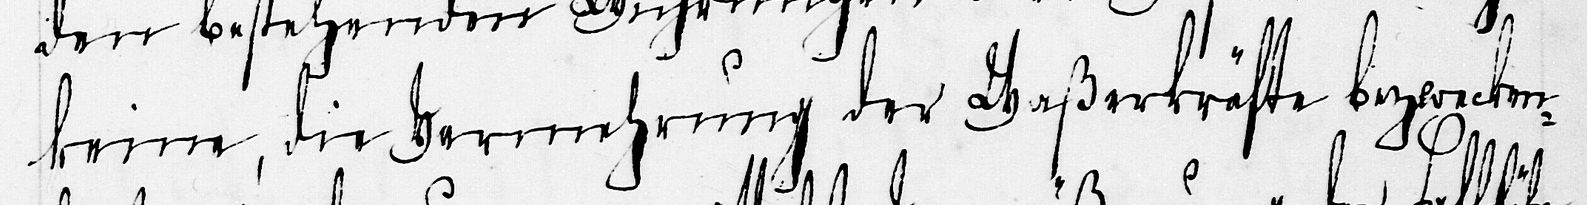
keine, die Vermehrung der Waßerkräfte bezwecken¬
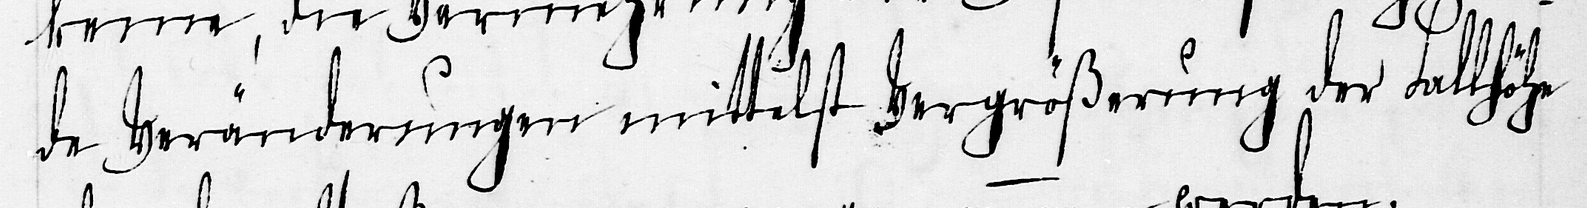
de Veränderungen mittelst Vergrößerung der Fallhöhe
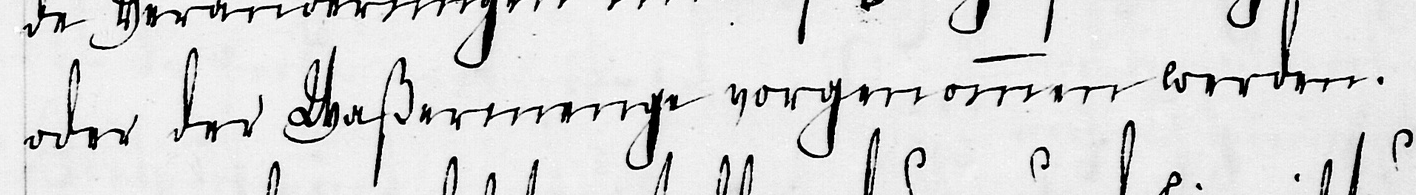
oder der Waßermenge vorgenommen werden.
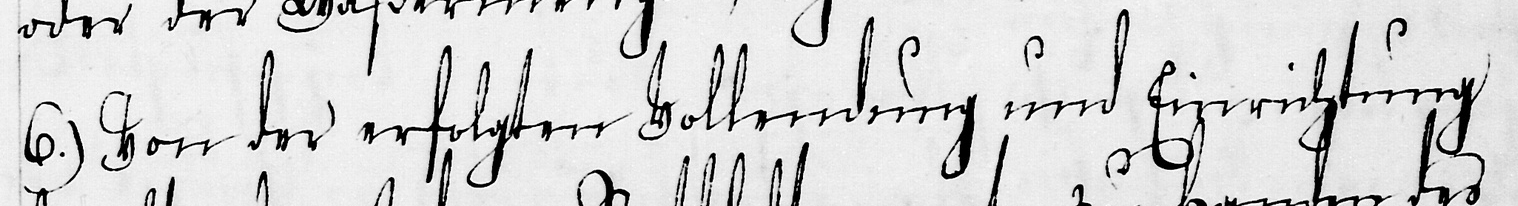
6.) Von der erfolgten Vollendung und Einrichtung
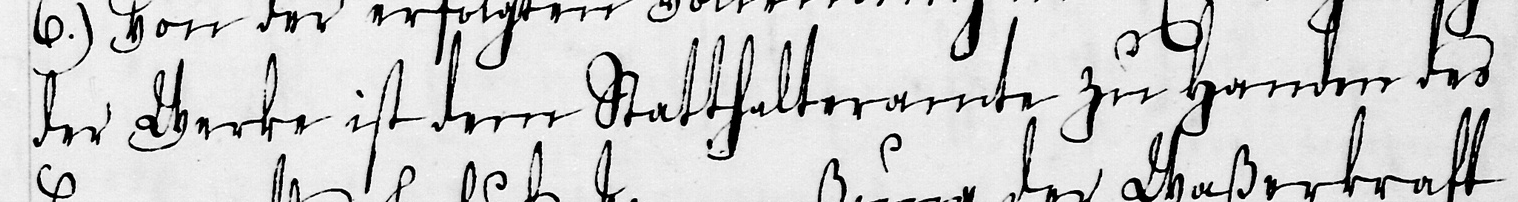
der Werke ist dem Statthalteramte zu Handen des
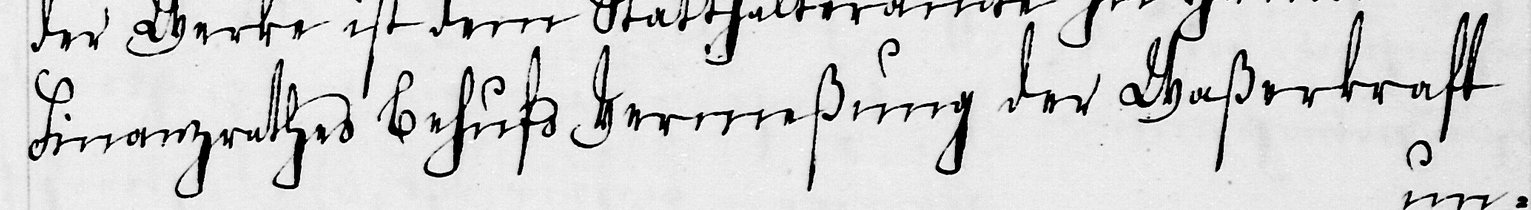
Finanzrathes Behufs Vermeßung der Waßerkraft
